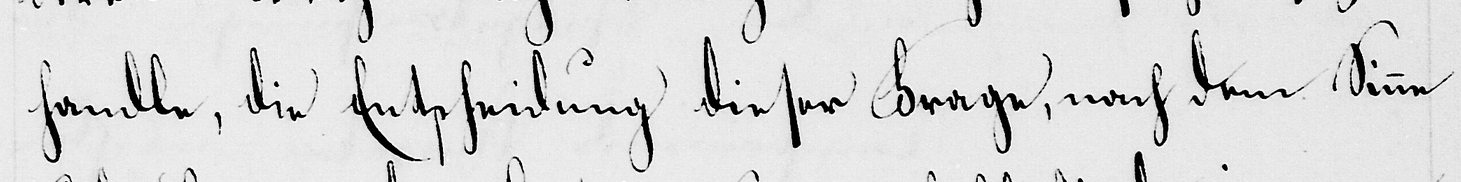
handle, die Entscheidung dieser Frage, nach dem Sinn
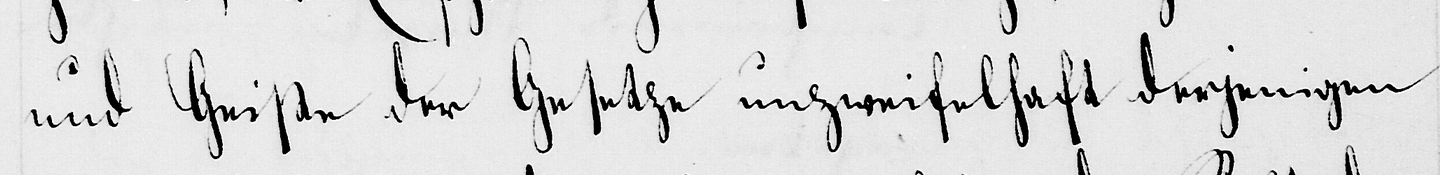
und Geiste der Gesetze unzweifelhaft derjenigen
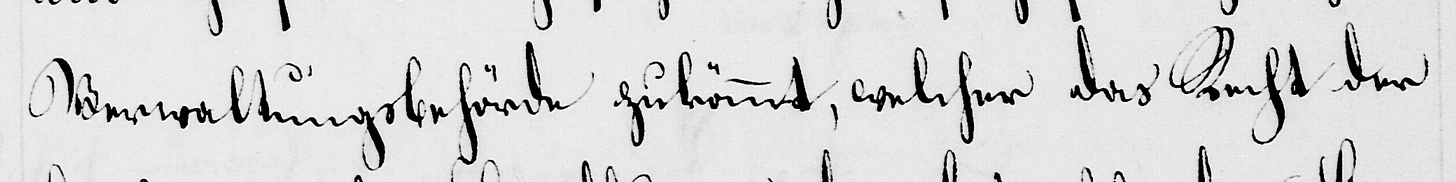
Verwaltungsbehörde zukommt, welcher das Recht der
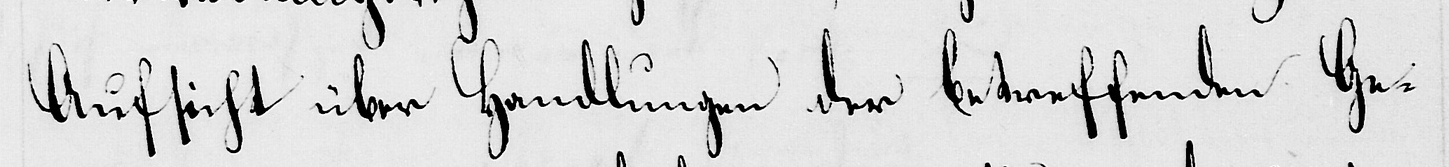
Aufsicht über Handlungen der betreffenden Ge¬
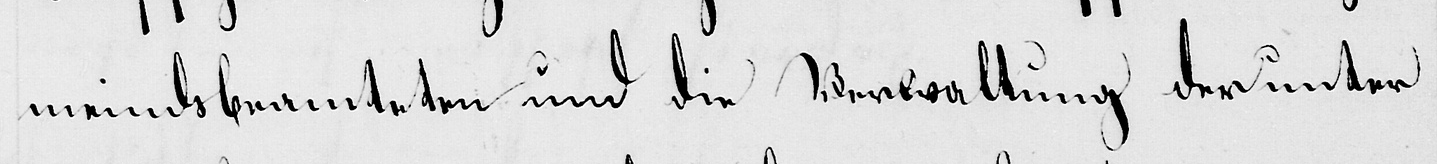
meindsbeamteten und die Verwaltung der unter
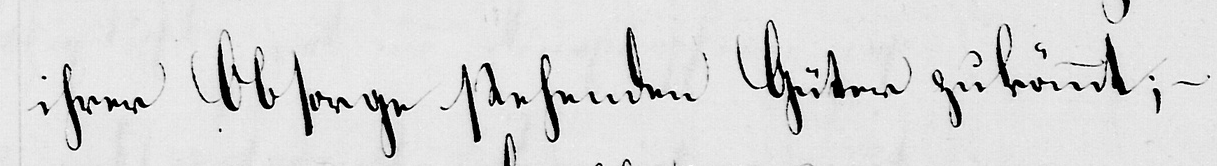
ihrer Obsorge stehenden Güter zukommt;
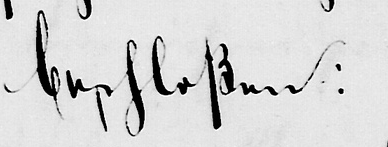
beschloßen:
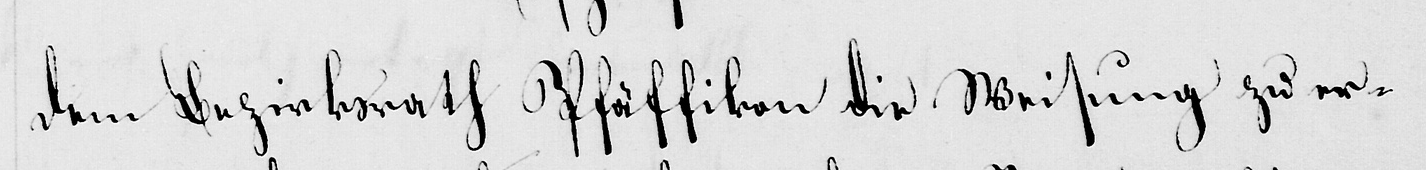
Dem Bezirksrath Pfäffikon die Weisung zu er¬
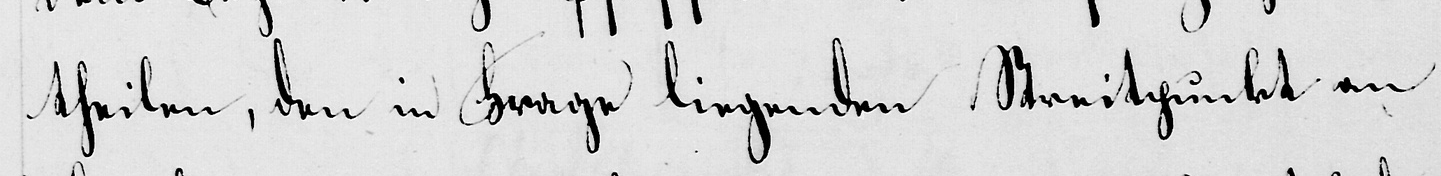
theilen, den in Frage liegenden Streitpunkt an
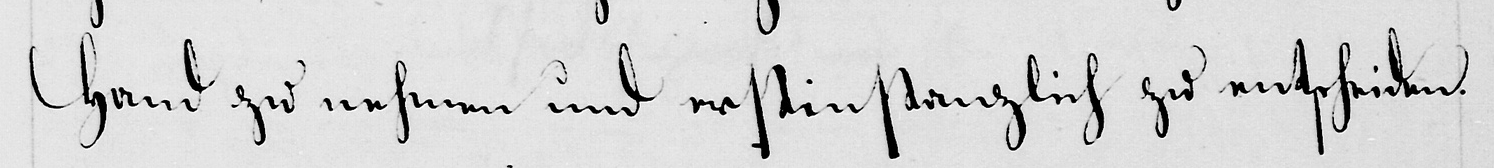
Hand zu nehmen und erstinstanzlich zu entscheiden.
